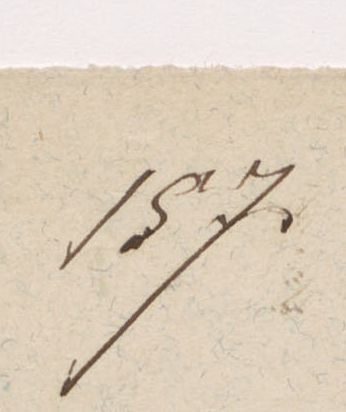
157.
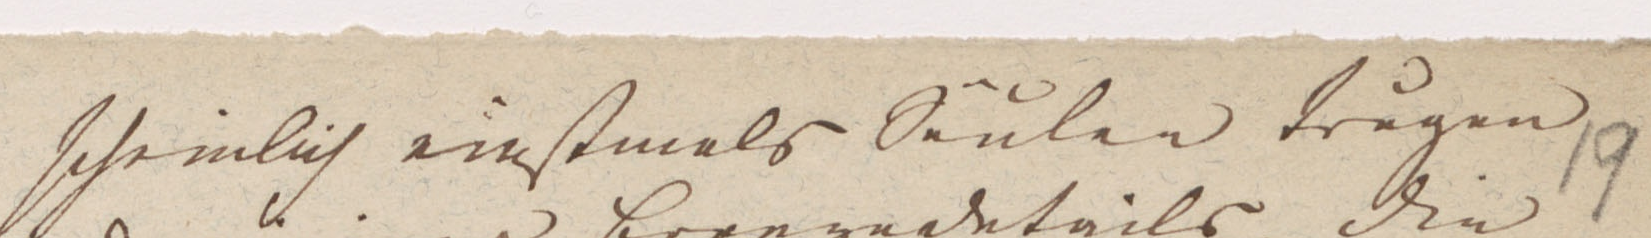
scheinlich einstmals Säulen trugen
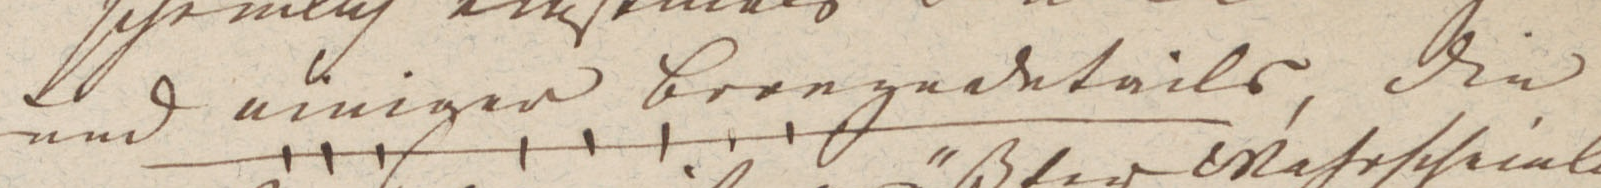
und einiger Bronzedetails, die
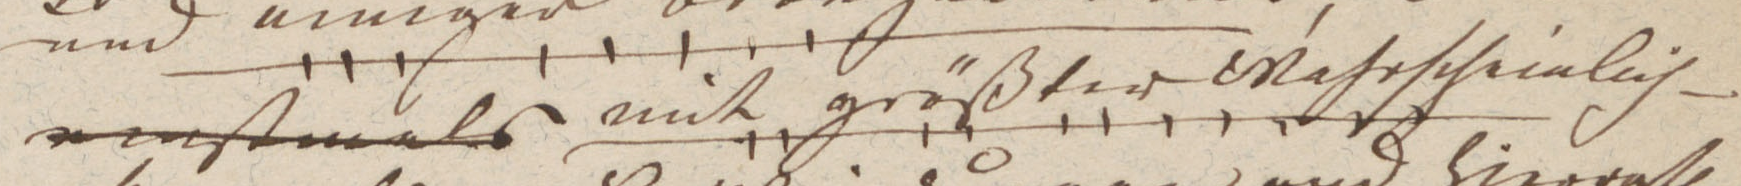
einstmals mit grösster Wahrscheinlich-
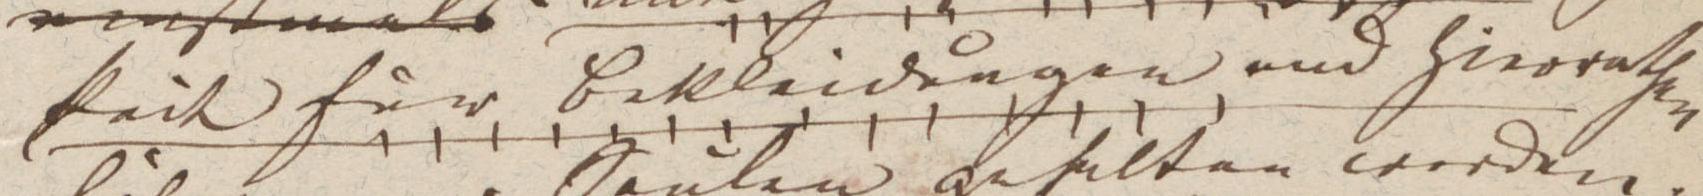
keit für Bekleidungen und Zierrathen
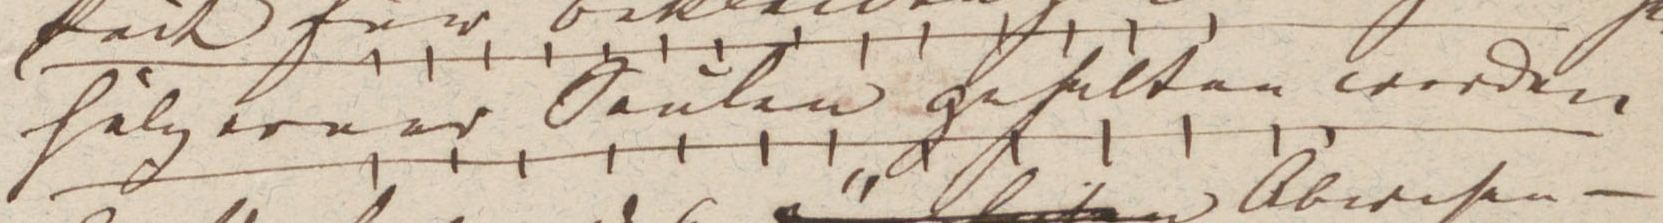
hölzerner Säulen gehalten werden.
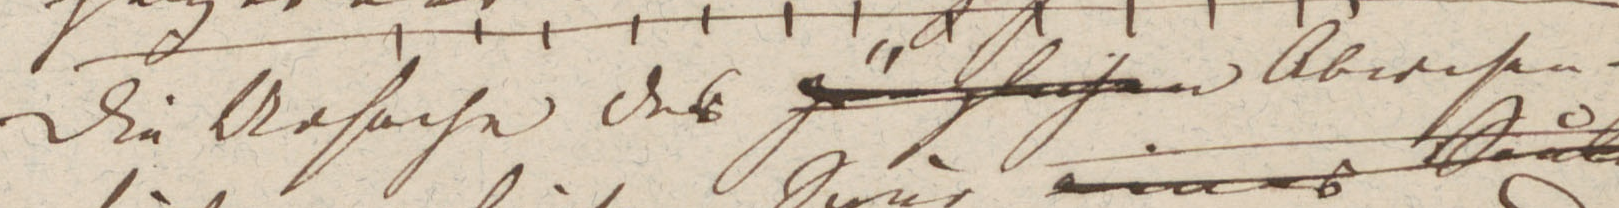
Die Ursache desr gänzlichen Abwesen-
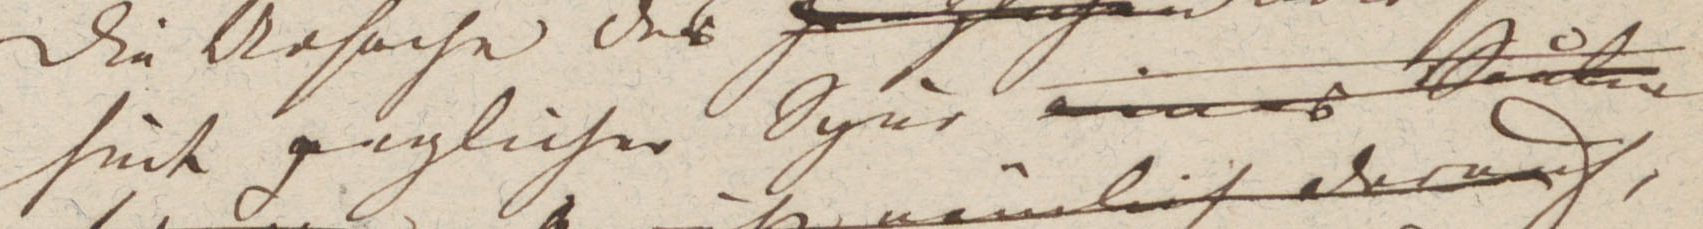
heit jeglicher Spur eines Saulen
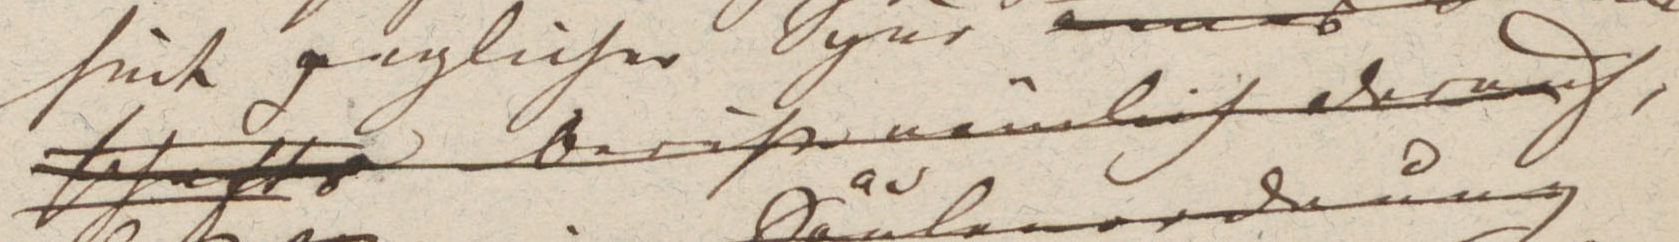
schaft b beruht nämlich darauf,
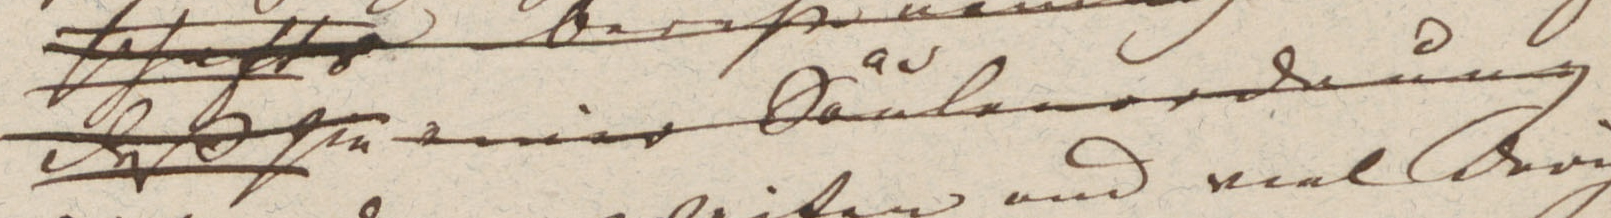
dass sie einer Säulenordnung
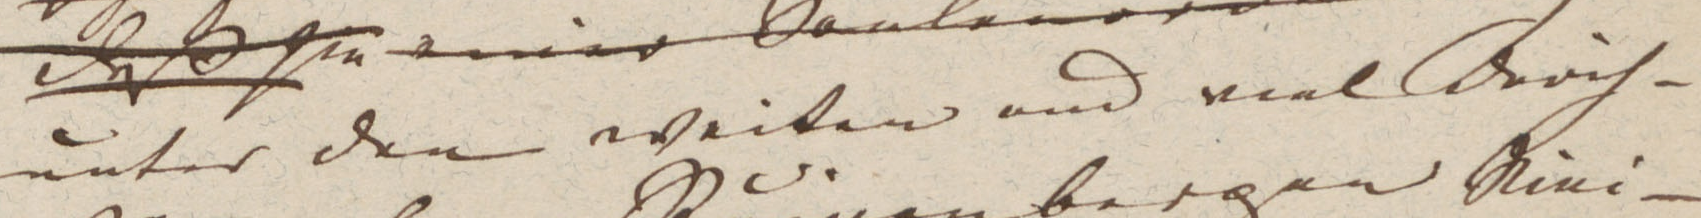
unter den weiten und viel durch-
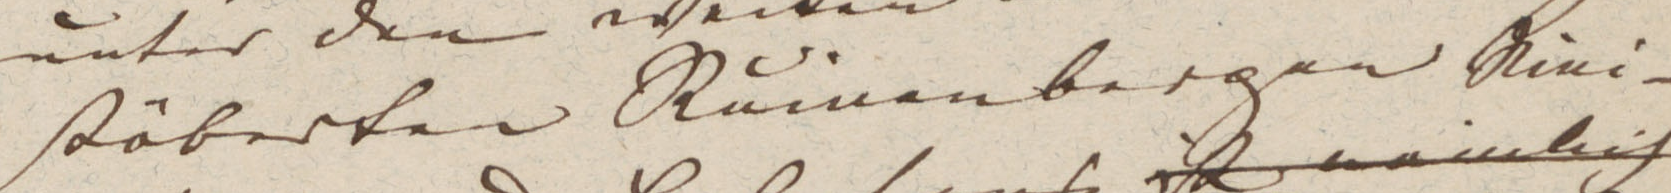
stöberten Ruinenbergen Nini-
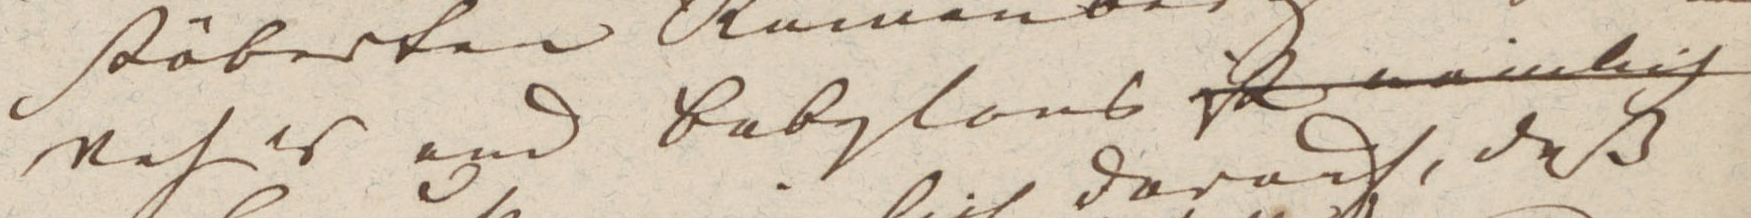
vehs und Babylons ist nämlich
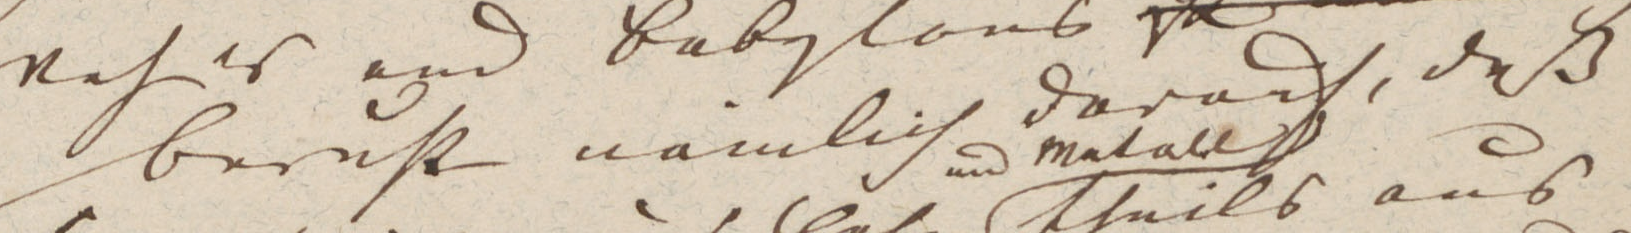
beruht nämlich darauf, dass
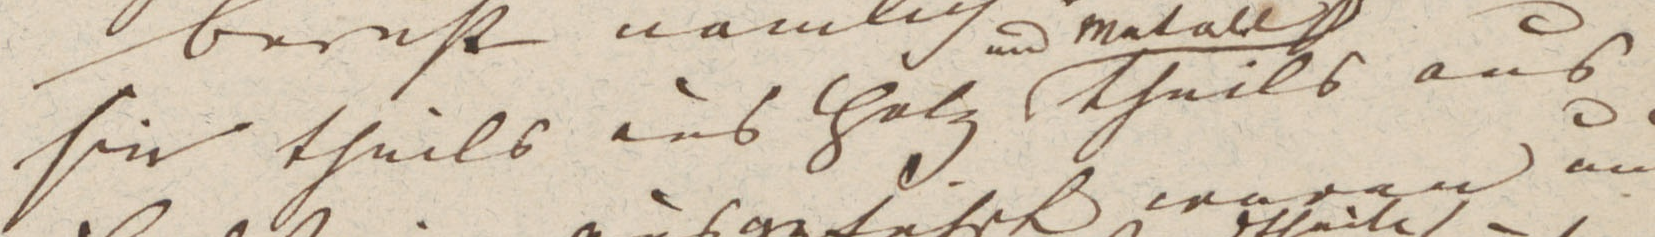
sie theils aus Holz und Metall theils aus
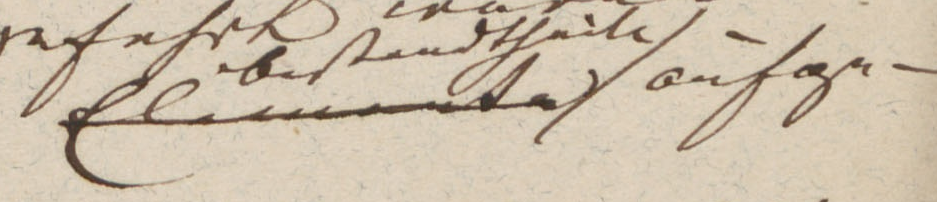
Elemente Bestandtheileaufge-
